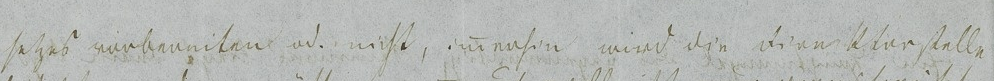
setzes vorbereiten od. nicht, immerhin wird die Direktorstelle
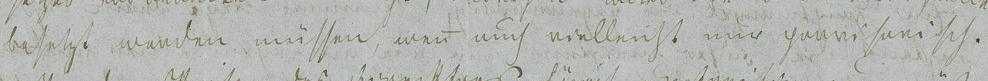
besetzt werden müssen, wenn auch vielleicht nur provisorisch.
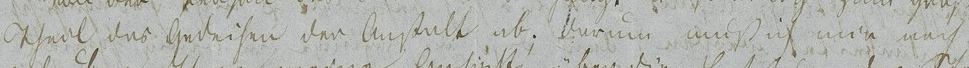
Theil das Gedeihen der Anstalt ab. Darum muß ich mir noch
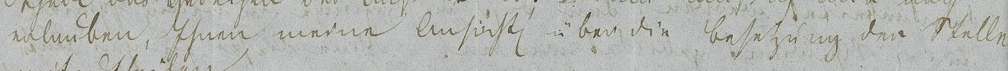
erlauben, Ihnen meine Ansichten über die Besetzung der Stelle
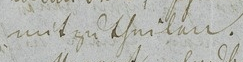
mitzutheilen.
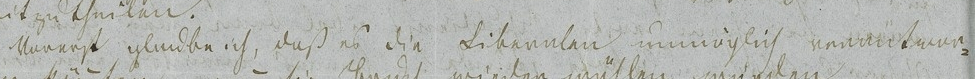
Vorerst glaube ich, daß es die Liberalen unmöglich verantwor-
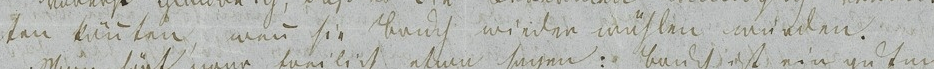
ten könnten, wenn sie Bruch wieder wählen würden.
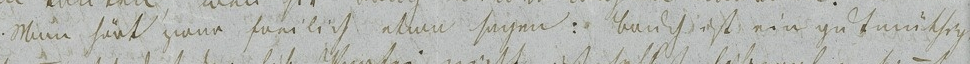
Man hört zwar freilich etwa sagen: Bruch ist ein gutmüthiger
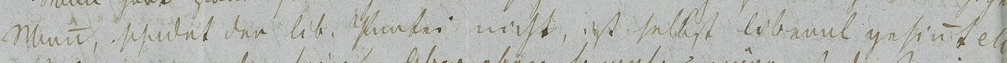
Mann, schadet der lib. Partei nicht, ist selbst liberal gesinnt etc.
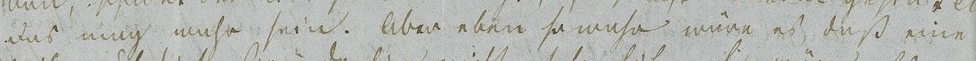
Das mag wahr sein. Aber eben so wahr wäre es, daß eine
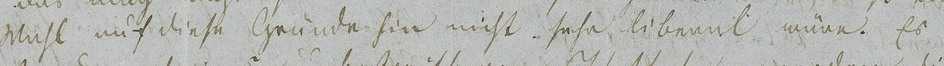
Wahl auf diese Gründe hin nicht sehr liberal wäre. Es
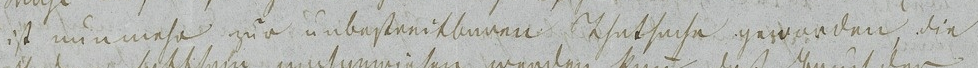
ist nunmehr zur unbestreitbaren Thatsache geworden, die
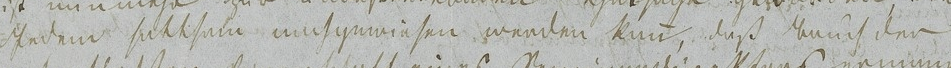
Jedem sattsam nachgewiesen werden kann, daß Bruch der
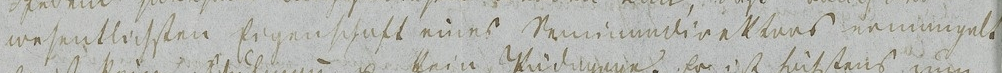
wesentlichsten Eigenschaft eines Seminardirektors ermangelt.
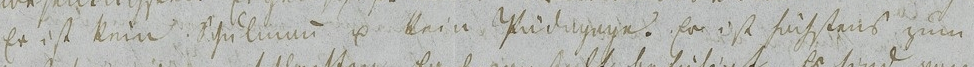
Er ist kein Schulmann & kein Pädagoge. Er ist höchstens zum
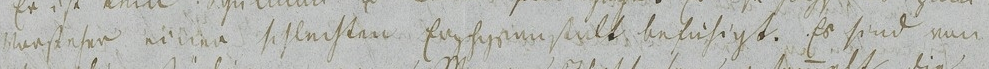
Vorsteher einer schlechten Erzhgsanstalt befähigt. Es sind von
